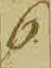6.
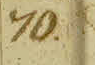70.
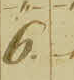6.
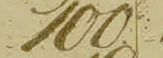100.
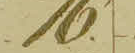16.
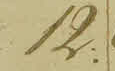12.
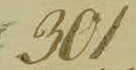301
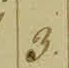3.
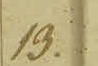13.
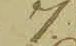7.
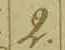2.
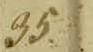35.
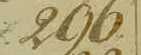296.
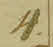4.
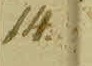14.
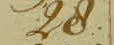28.
